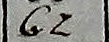62
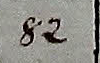82
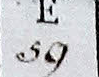59
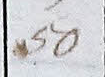50
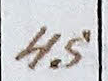45
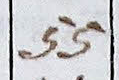55
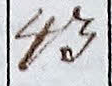43
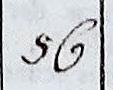56
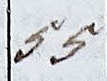55
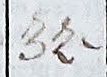32
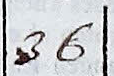36
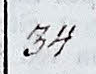34
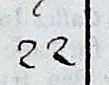22
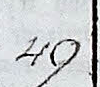49
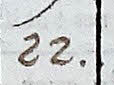22.
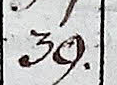39.
